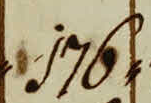176
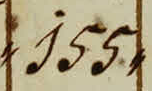155
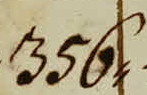356
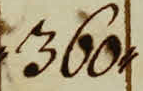360
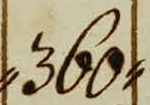360
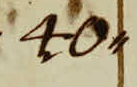40
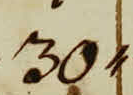30
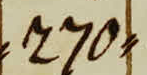270
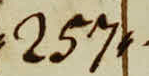257
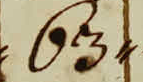63
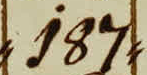187
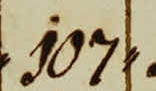107
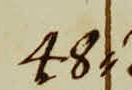48
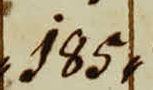185
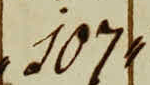107
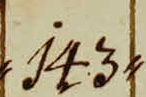143
